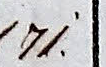71.
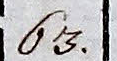63.
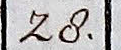28.
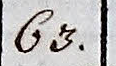63.
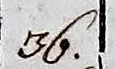36.
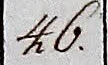46.
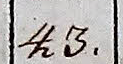43.
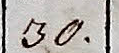30.
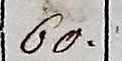60.
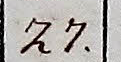27.
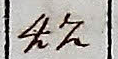42
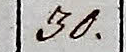30.
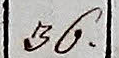36.
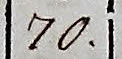70.
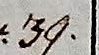39.
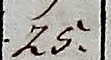25.
